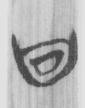昌
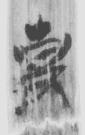吏
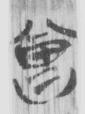曾
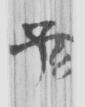孫
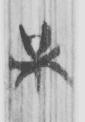某
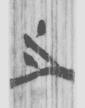之
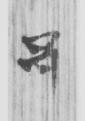邑
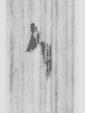人
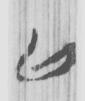㠯（以）
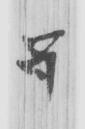邑
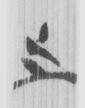之
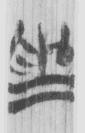爲
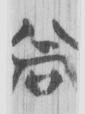尚
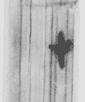十
